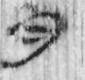月
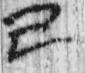己
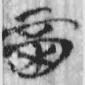梄（酉）
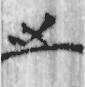之
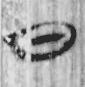日
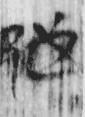○（越）
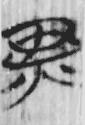異
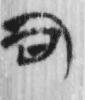司
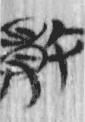敗
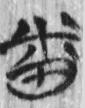番
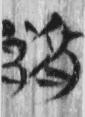豫
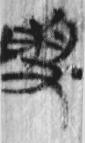受
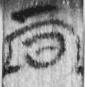○（期）
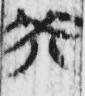癸
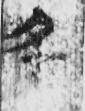丑
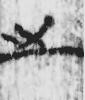之
